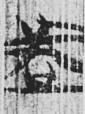者
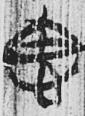思
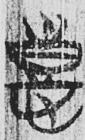○（喜）
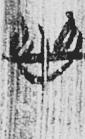○（葸）
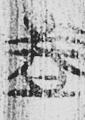者
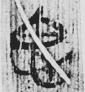思
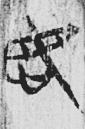○（悔）
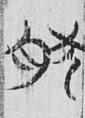○（然）
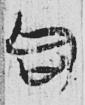句（後）
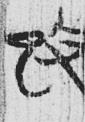改
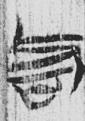○（始）
